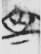室
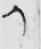人
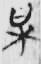某
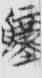瘽
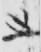之
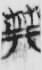典
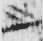之
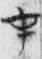才（在）
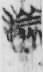漾
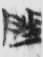陵
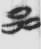厽（參）
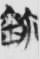鉨
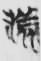漾
